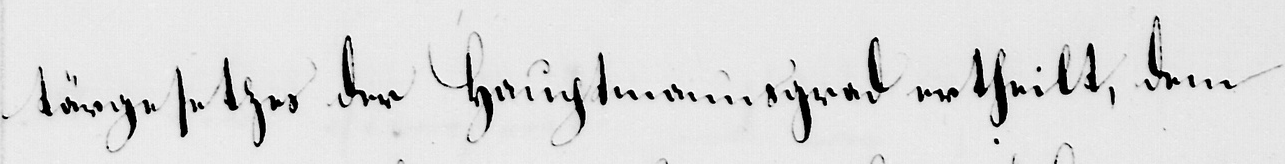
tärgesetzes der Hauptmannsgrad ertheilt, dem
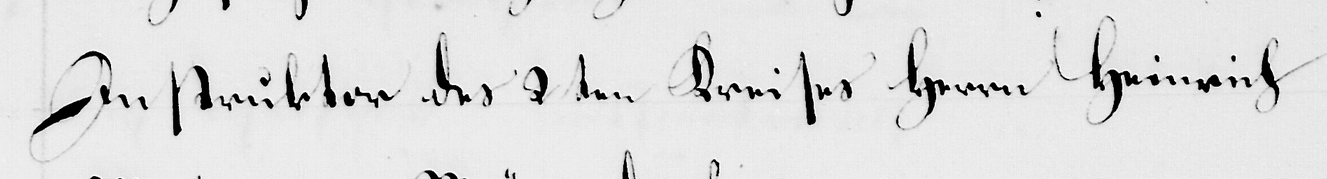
Instruktor des 2 ten Kreises Herrn Heinrich
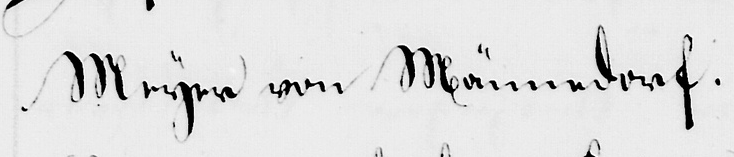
Meyer von Männedorf.
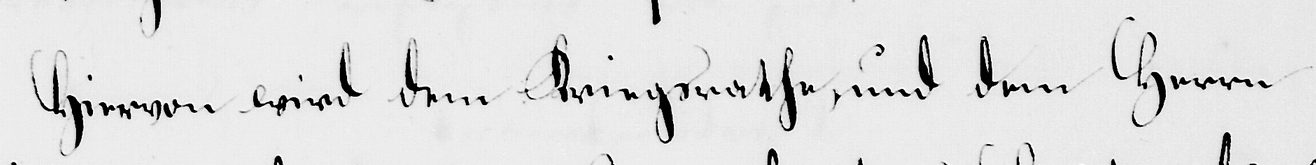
Hiervon wird dem Kriegsrathe, und dem Herrn
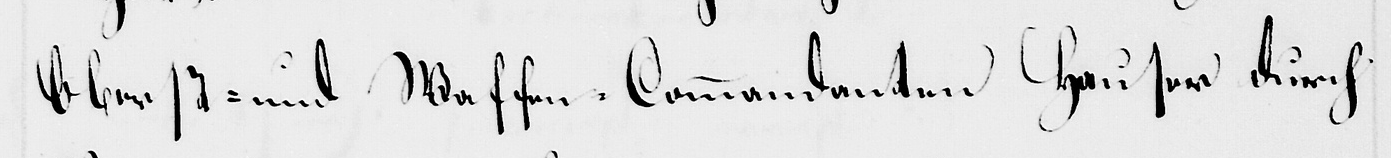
Oberst- und Waffen-Commandanten Hauser durch
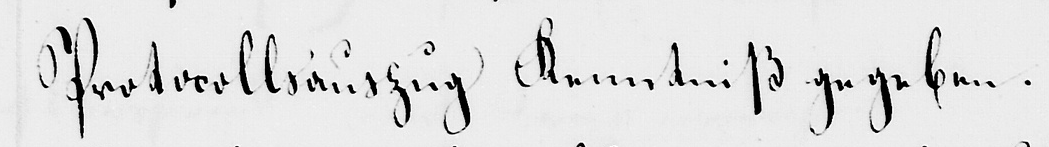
Protocollsauszug Kenntniß gegeben.
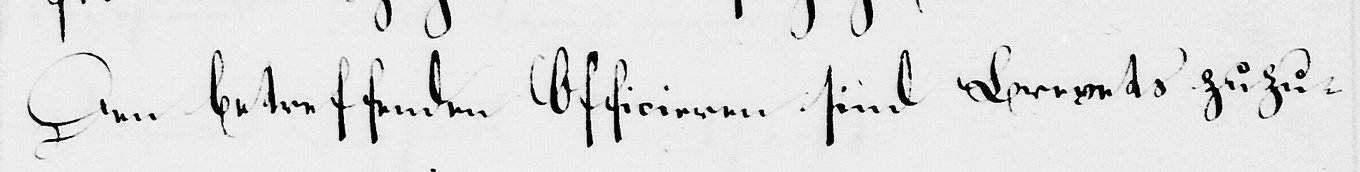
Den betreffenden Officieren sind Brevets zuzu¬
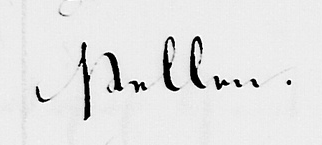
stellen.
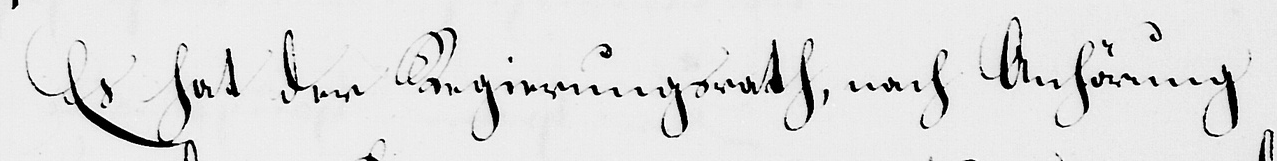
Es hat der Regierungsrath, nach Anhörung
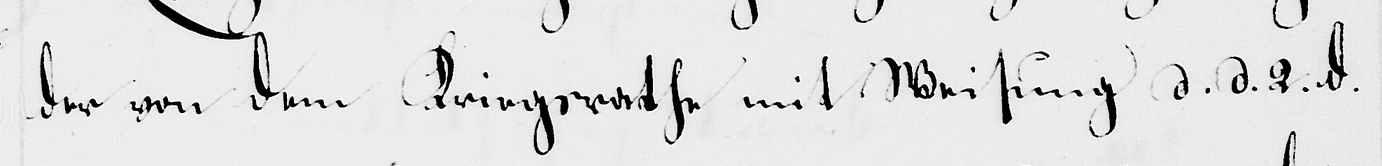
der von dem Kriegsrathe mit Weisung d. d. 2. d.
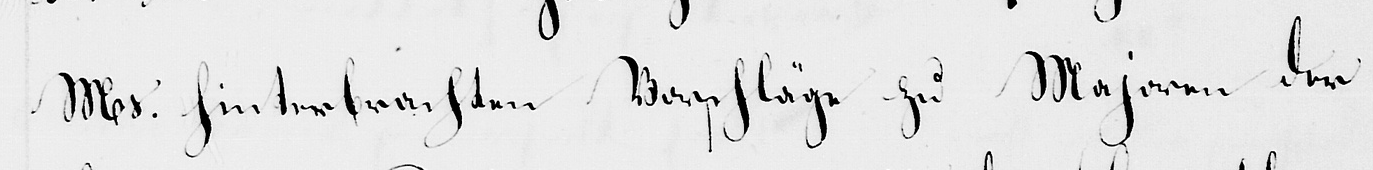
Ms. hinterbrachten Vorschläge zu Majoren der
